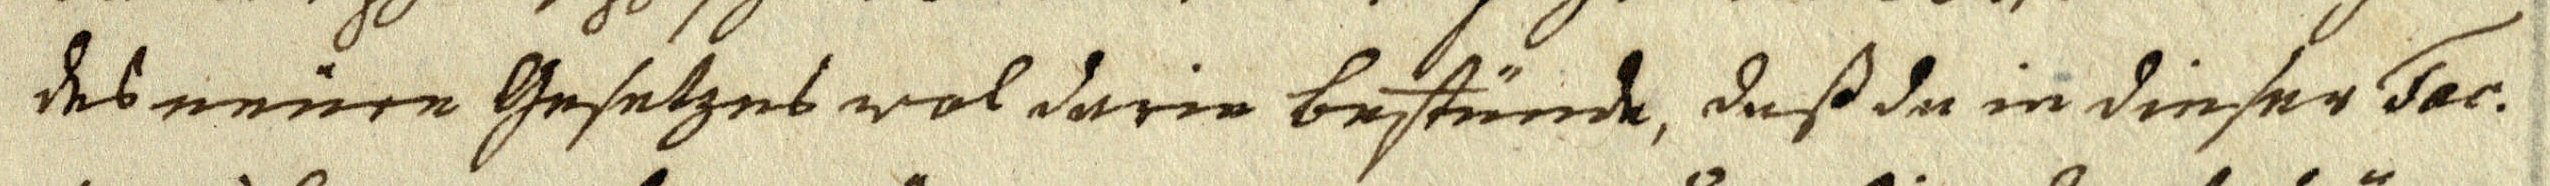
des neuen Gesetzes wol darin bestünde, daß da in dieser Fac.
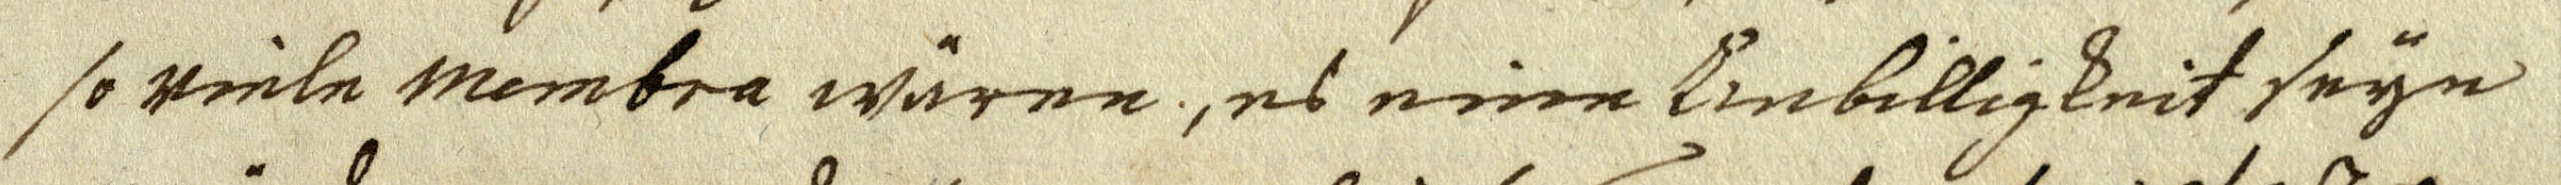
so viele Membra wären, es eine Unbilligkeit seÿn
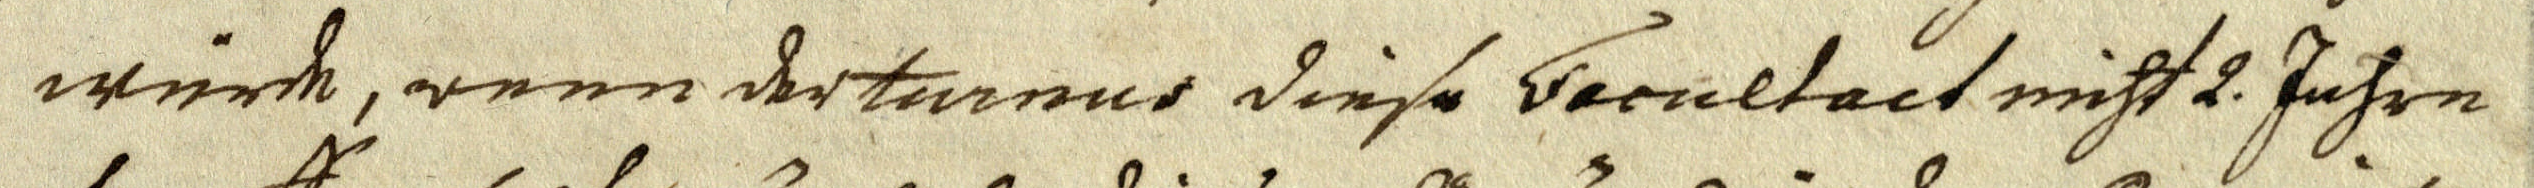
würde, wenn der turnus diese Facultaet nicht 2. Jahre
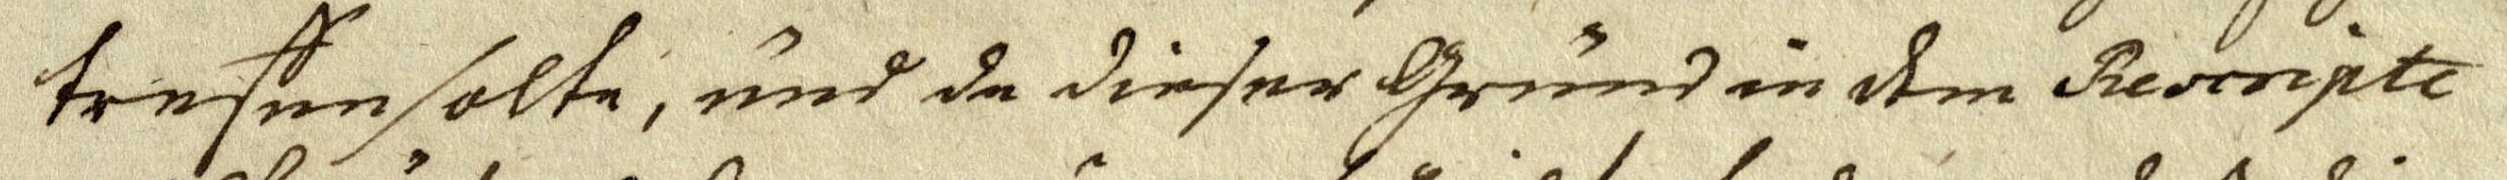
treffen solte, und da dieser Grund in dem Rescripte
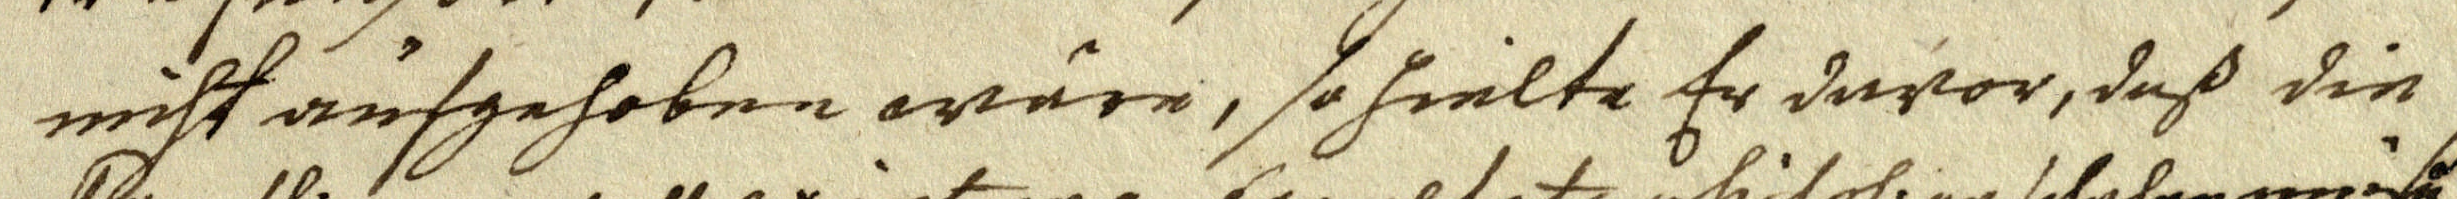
nicht aufgehoben wäre,so hielte Er davor, daß die
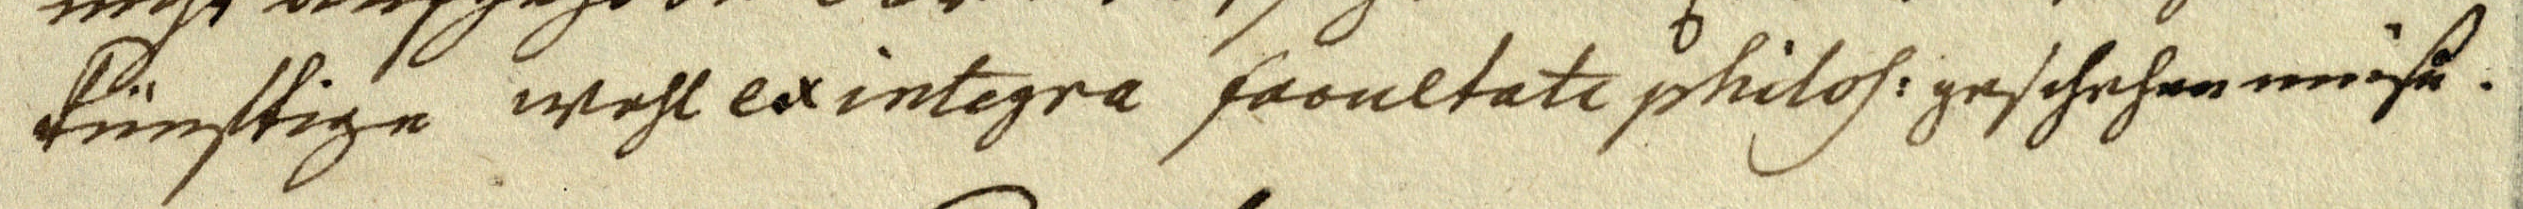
künftige Wahl ex integra facultate philos. geschehen müße.
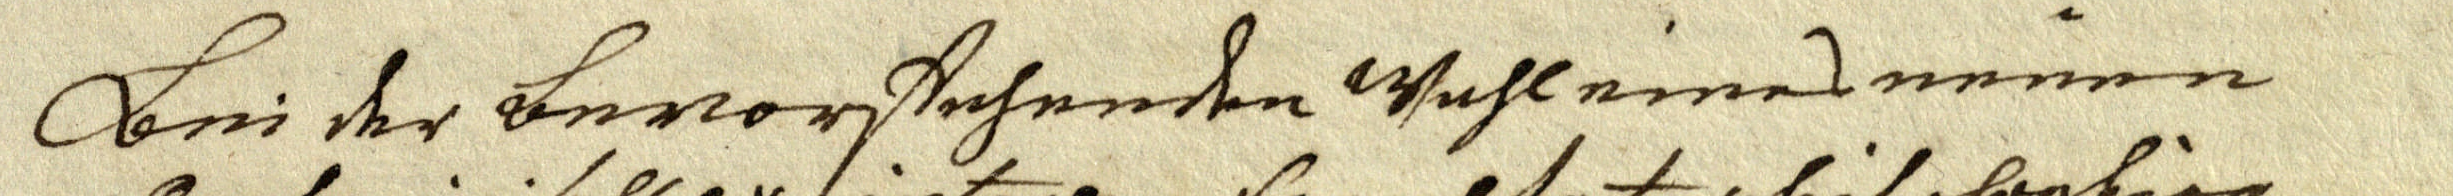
Bei der bevorstehenden Wahl eines neuen
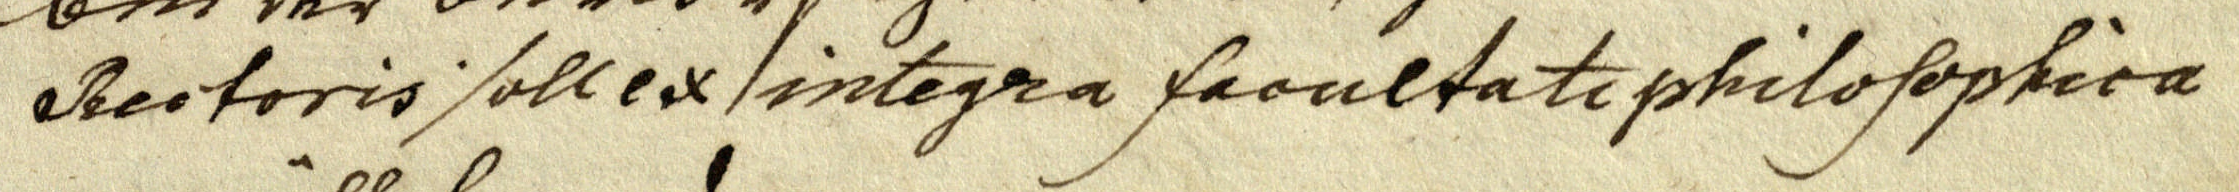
Rectoris soll ex integra facultati philosophica
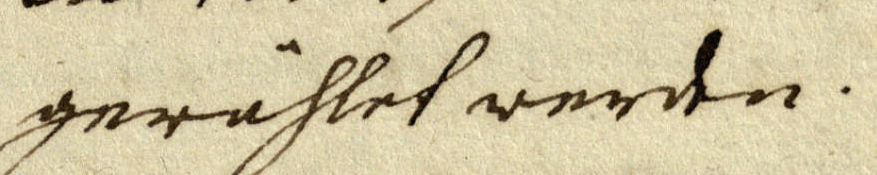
gewählet werden.
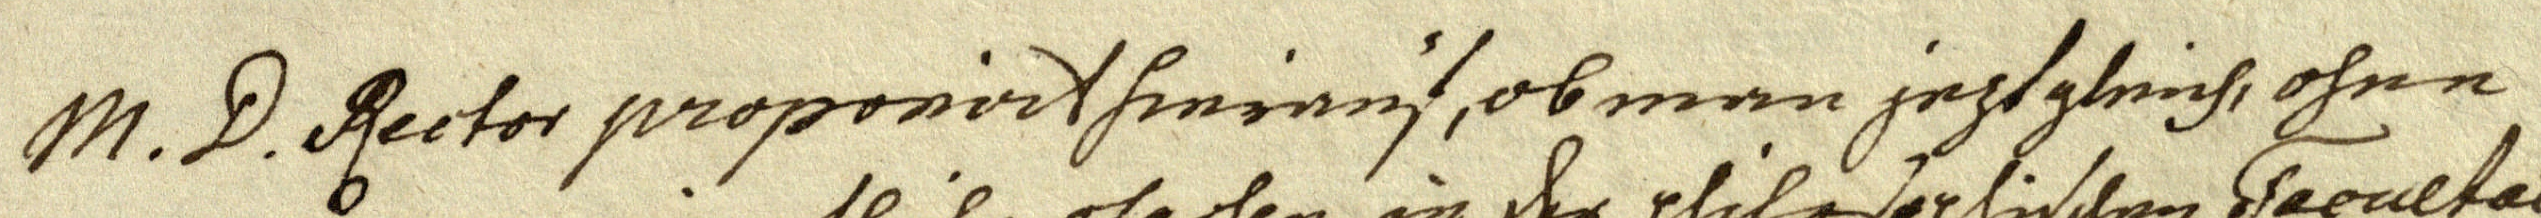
M. D. Rector proponirt hierauf, ob man jezt gleich, ohne
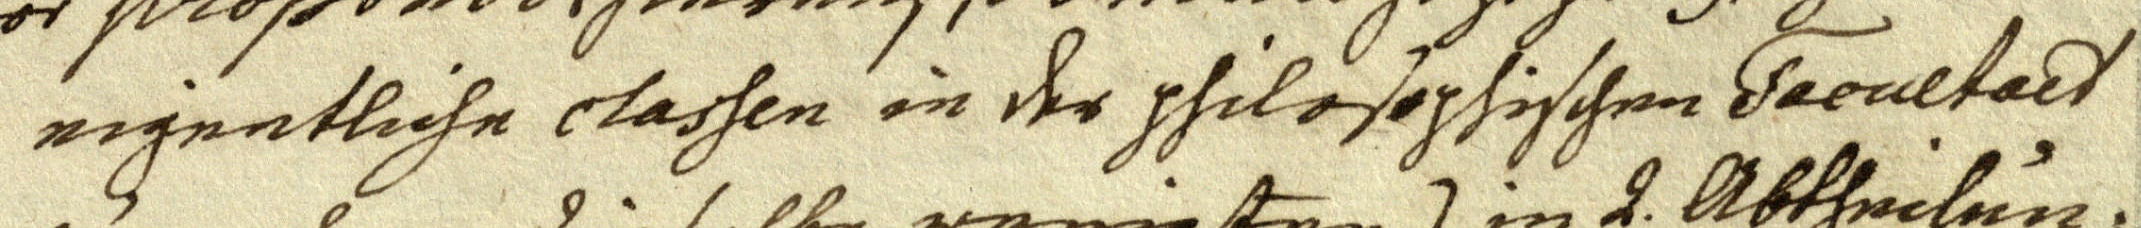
eigentliche classen in der philosophischen Facultaet
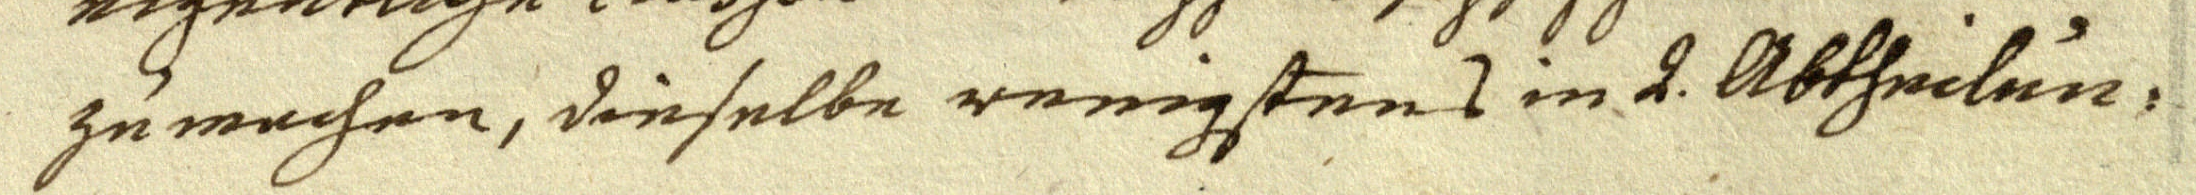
zu machen, dieselbe wenigstens in 2. Abtheilun¬
